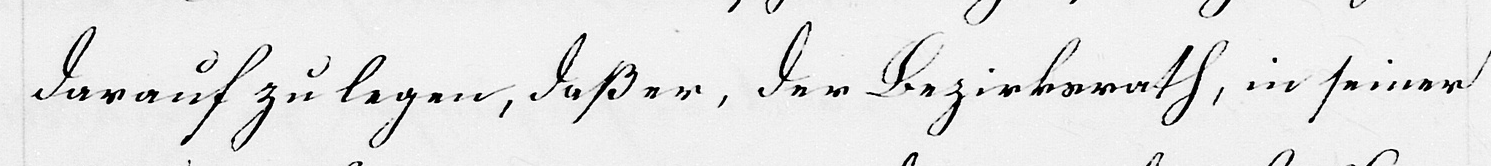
darauf zu legen, daß er, der Bezirksrath, in seiner
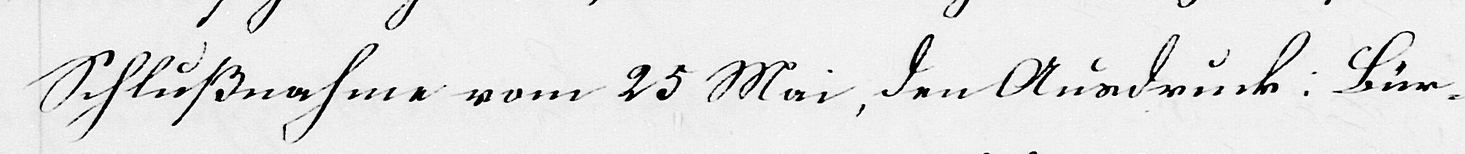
Schlußnahme vom 25 Mai, den Ausdruck: Bür¬
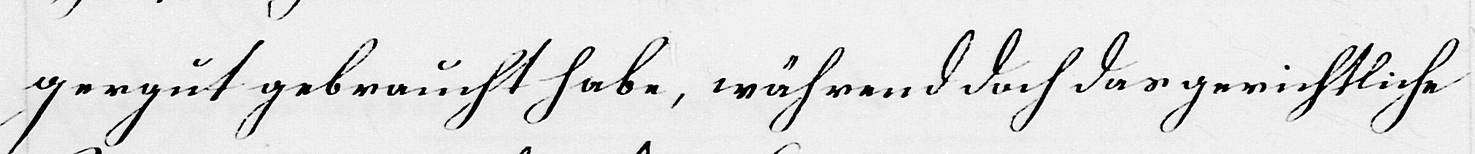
gergut gebraucht habe, während doch das gerichtliche
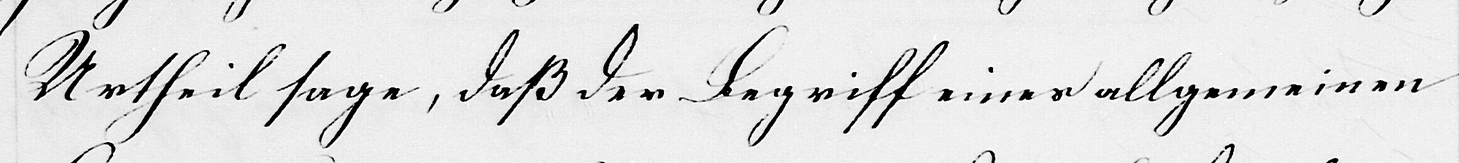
Urtheil sage, daß der Begriff eines allgemeinen
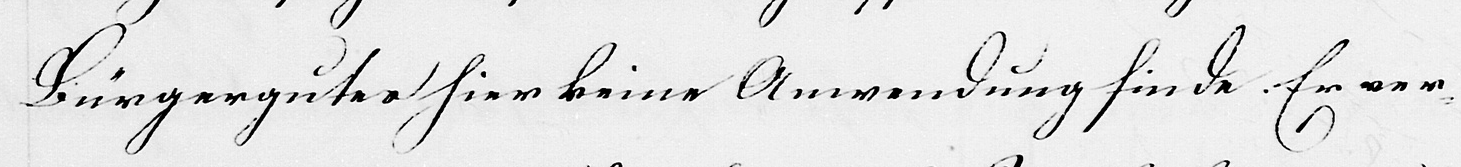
Bürgergutes hier keine Anwendung finde. Er ver¬
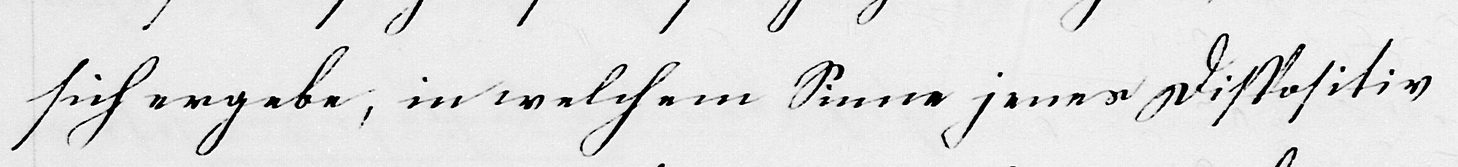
sich ergebe, in welchem Sinne jenes Dispositiv
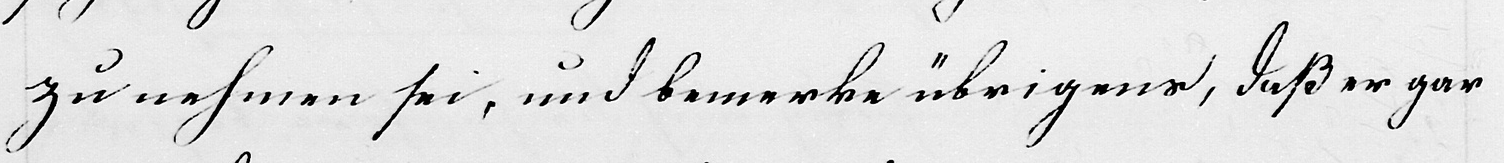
zu nehmen sei, und bemerke übrigens, daß er gar
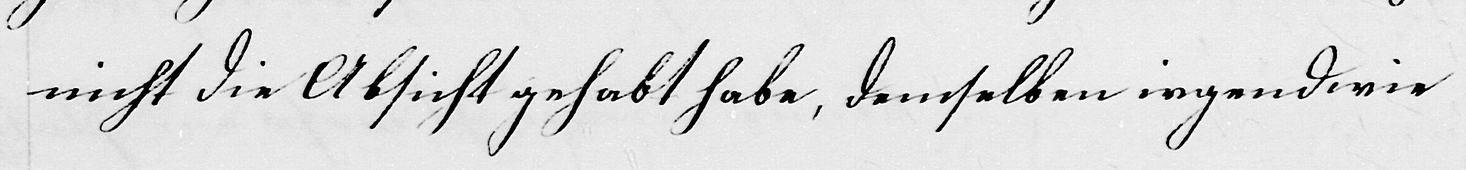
nicht die Absicht gehabt habe, demselben irgendwie
